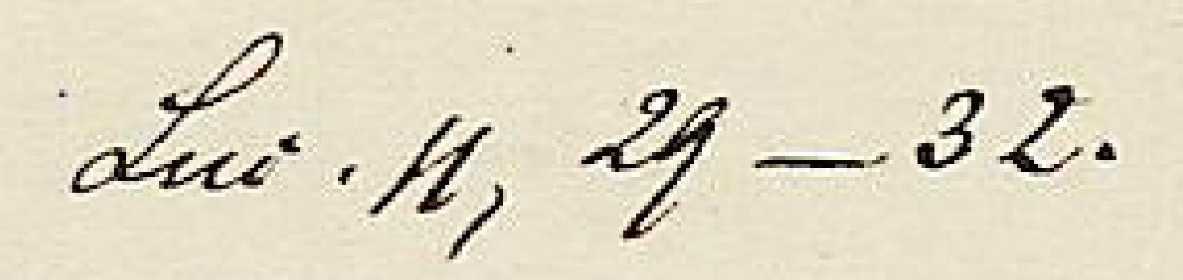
Luc. 11,29-32.
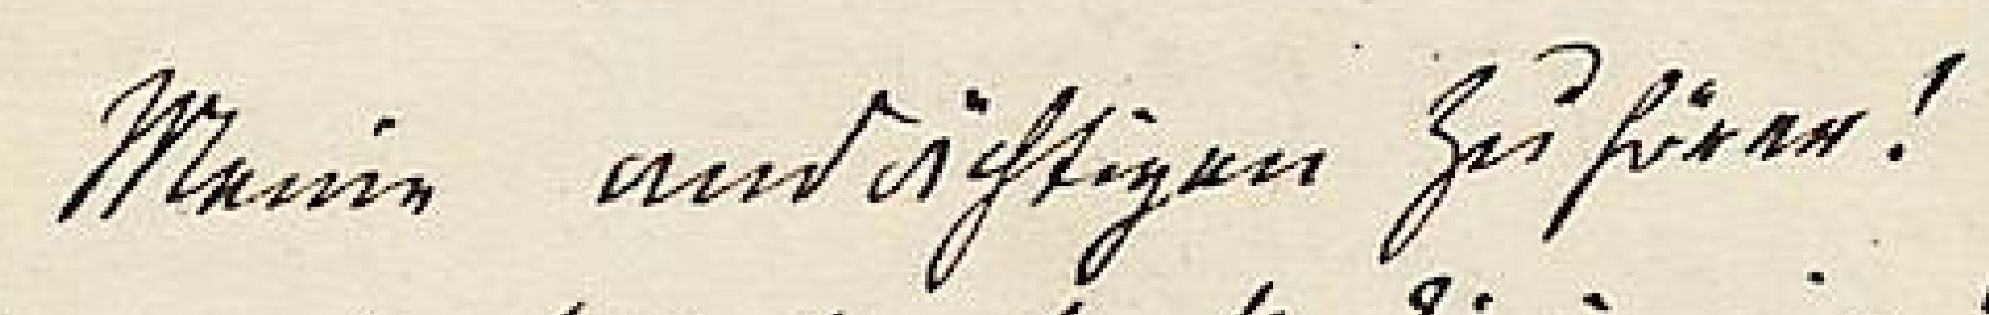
Mein andächtigen Zuhörer!
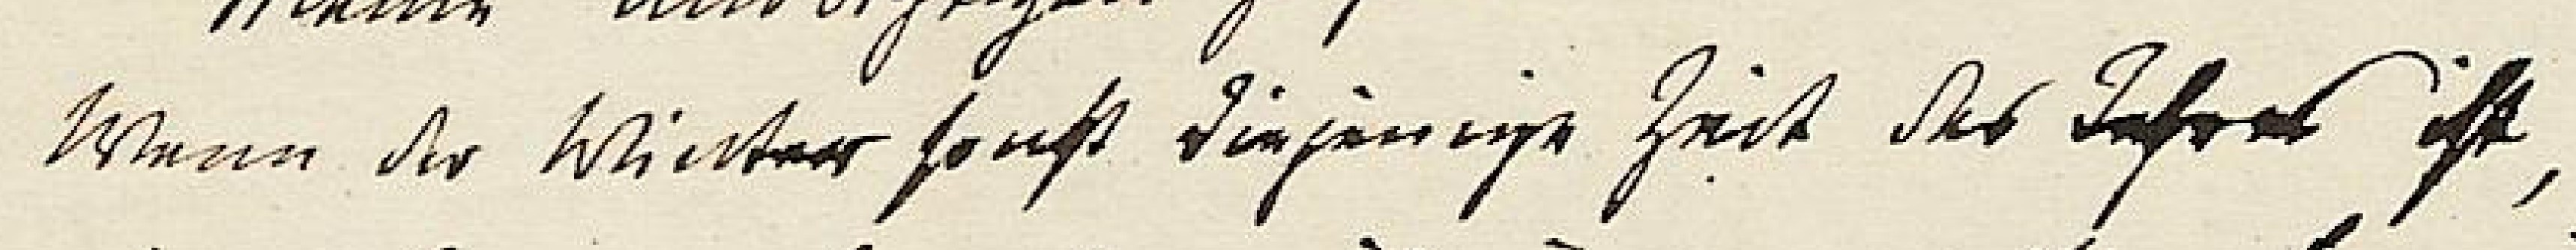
Wenn der Winter sonst diejenige Zeit des Jahres ist
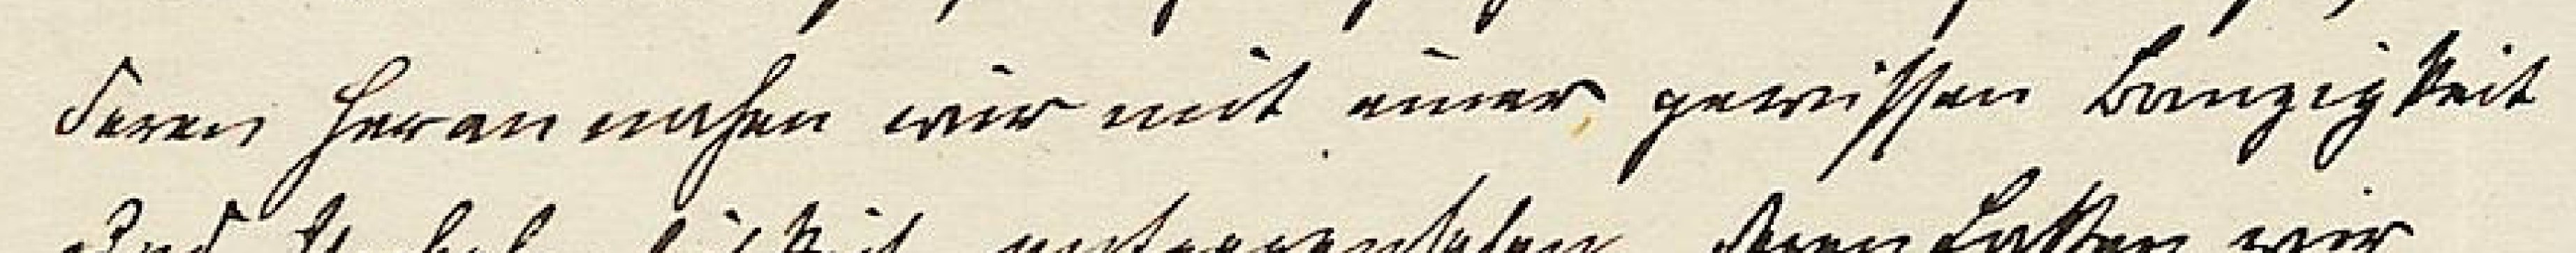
deren Herannahen wir mit einer gewissen Bangigkeit
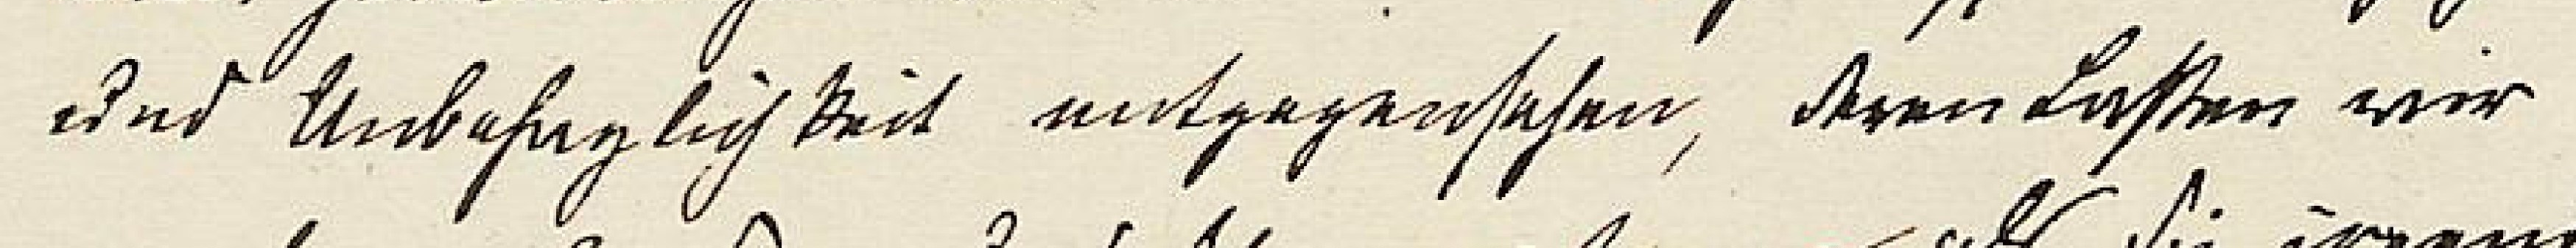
und Unbehaglichkeit, entgegensehen, deren Lasten wir
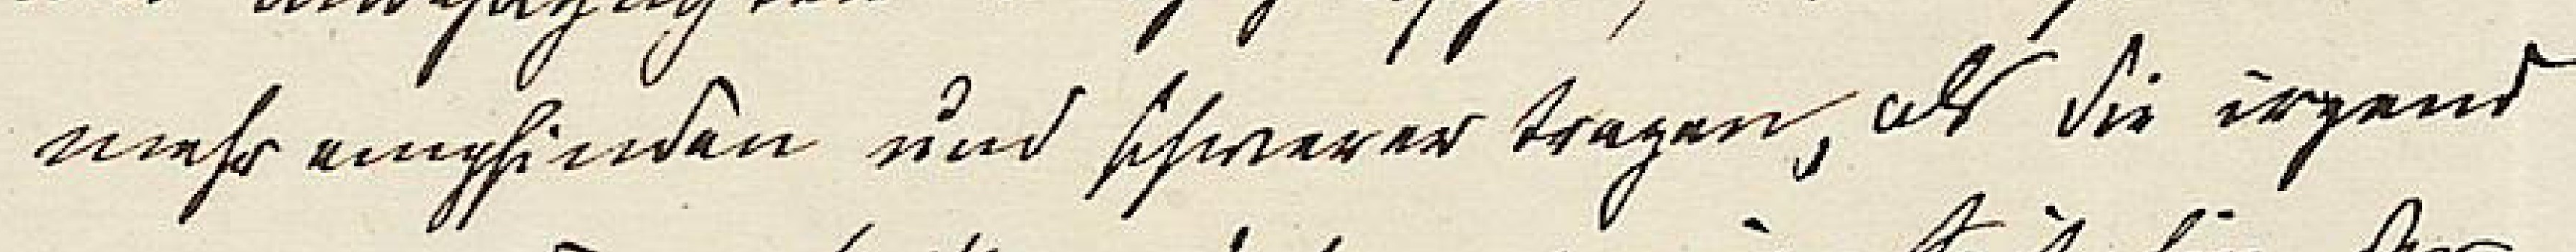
mehr empfinden und schwerer tragen, als die irgend
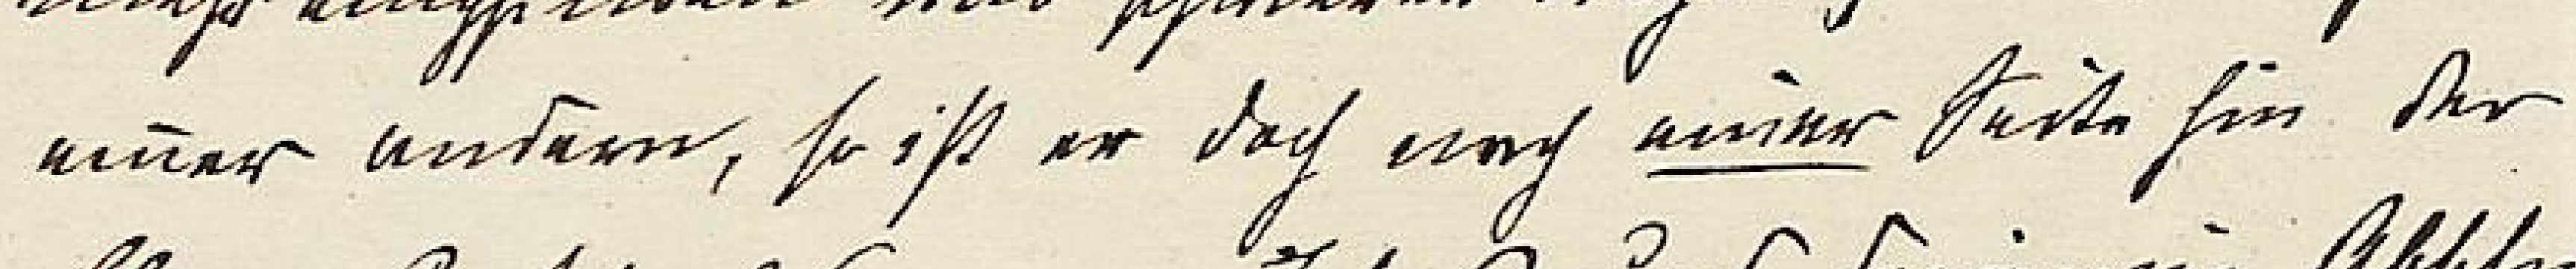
einer andern, so ist er doch nach einer Seite hin der
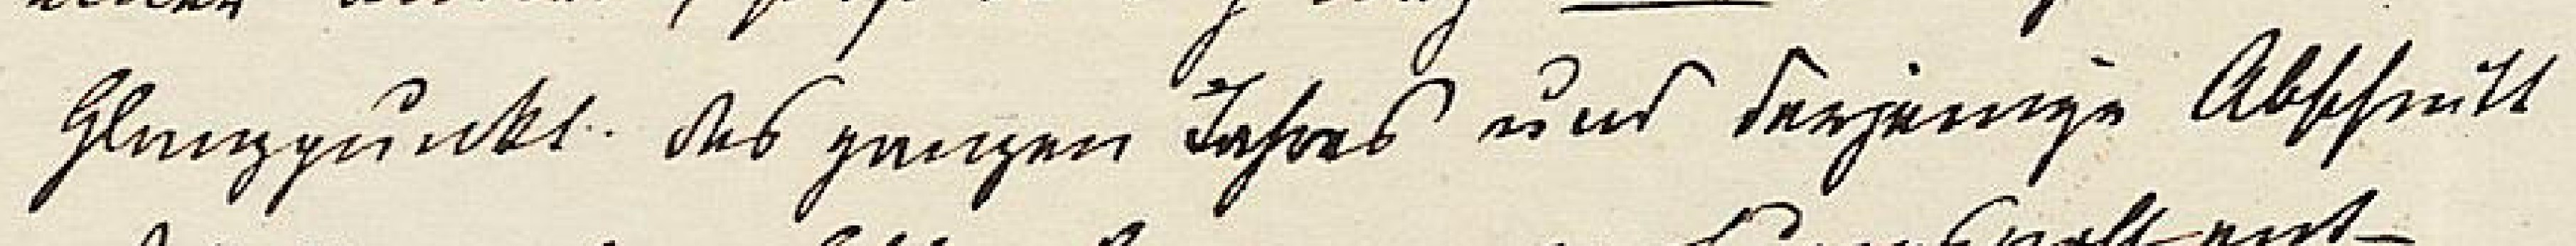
Glanzpunkt des ganzen Jahres und derjenige Abschnitt
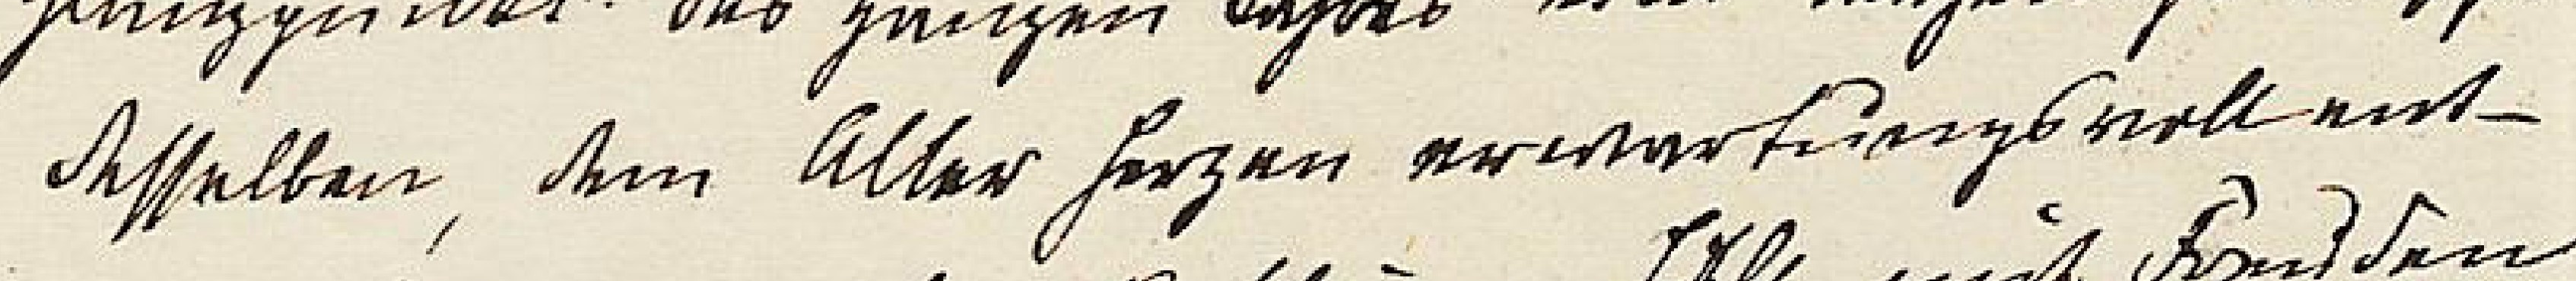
desselben, den Aller Herzen erwartungsvoll ent¬
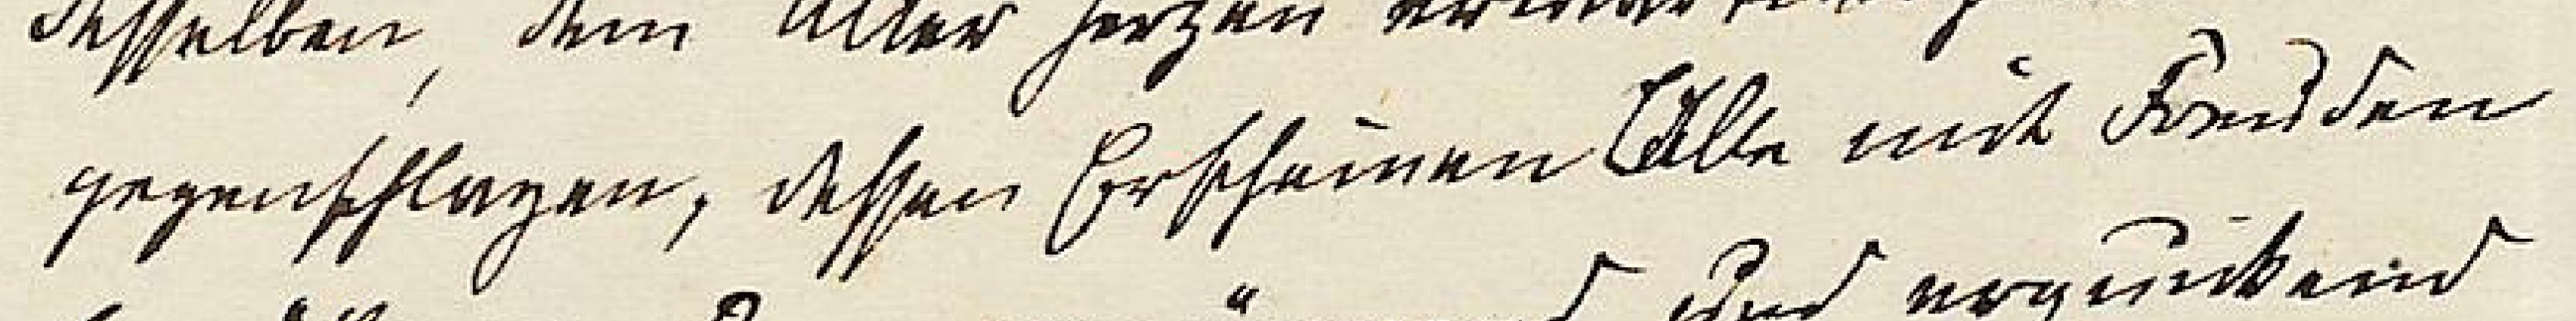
gegenschlagen, dessen Erscheinen Alle mit Freuden
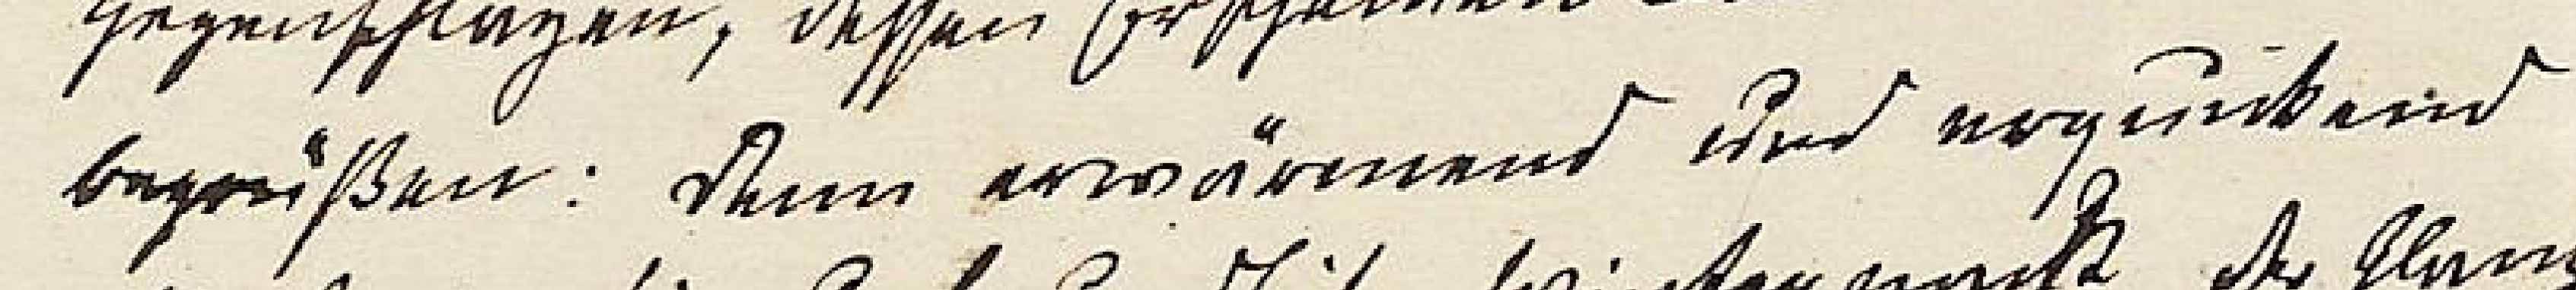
bengrüßen: Denn erwärmend und erquikend
